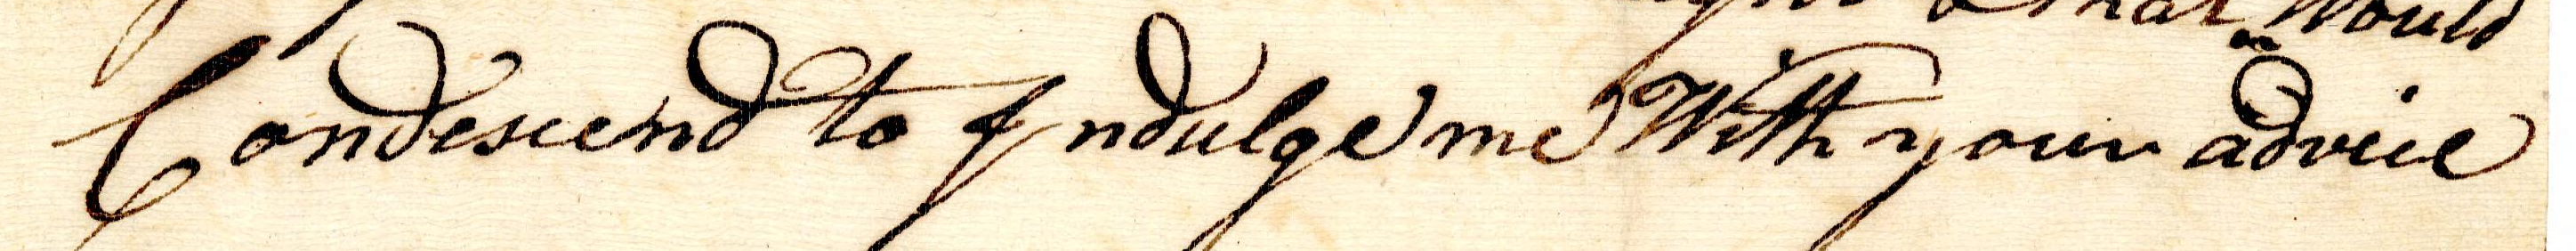Condescend to Indulge me With your advice
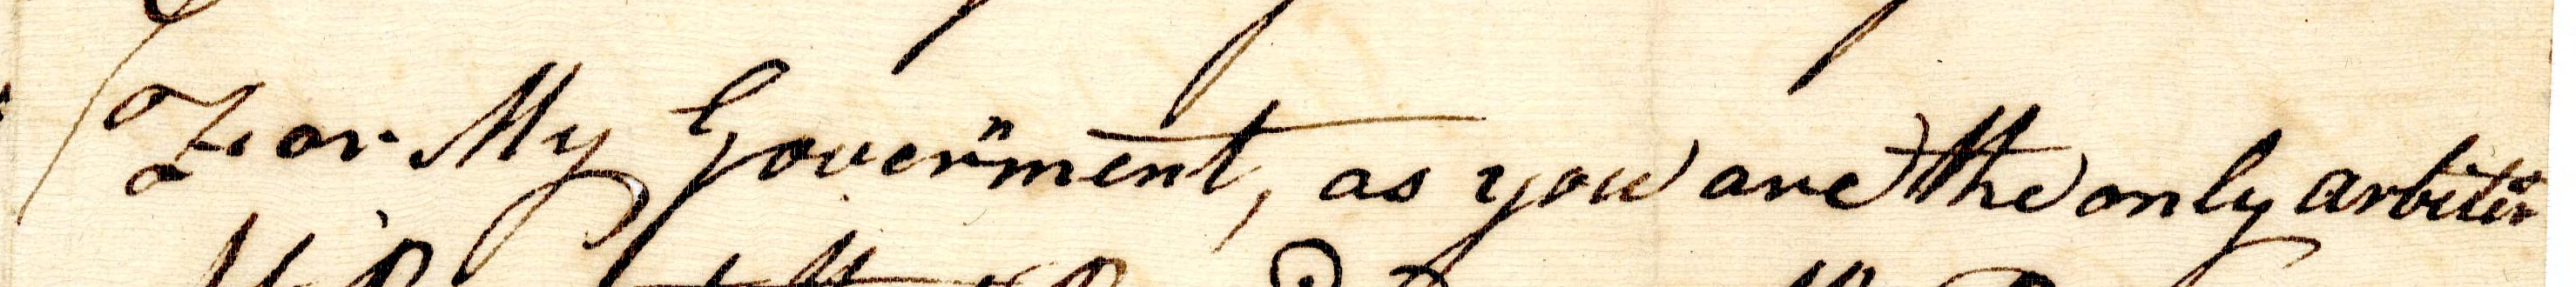For My Government, as you are the only arbiter
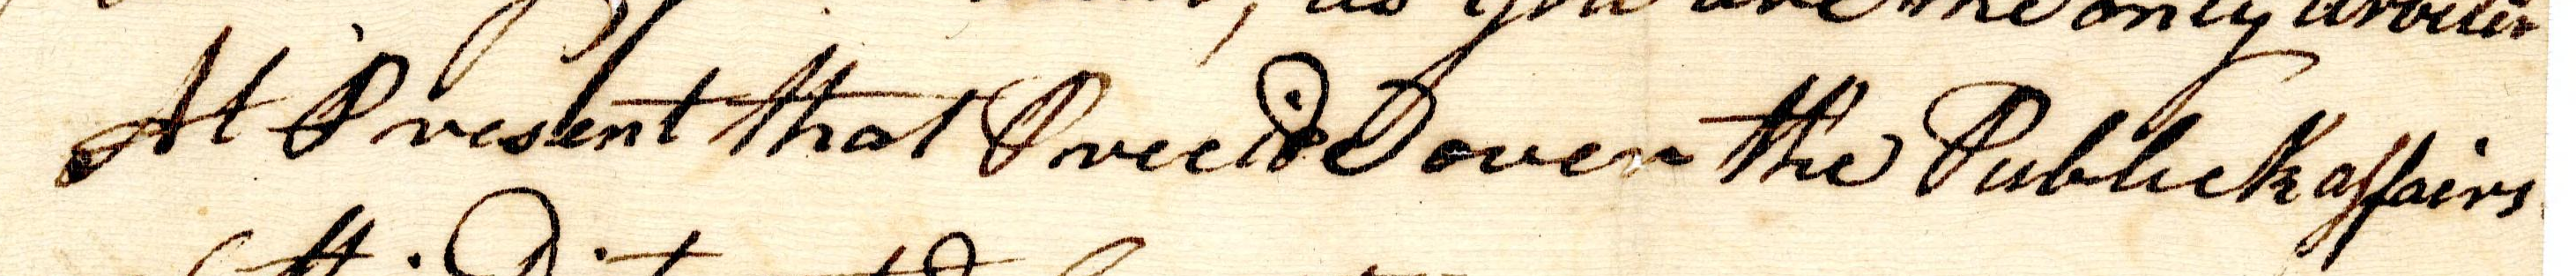At Present that Preside over the Publick affairs
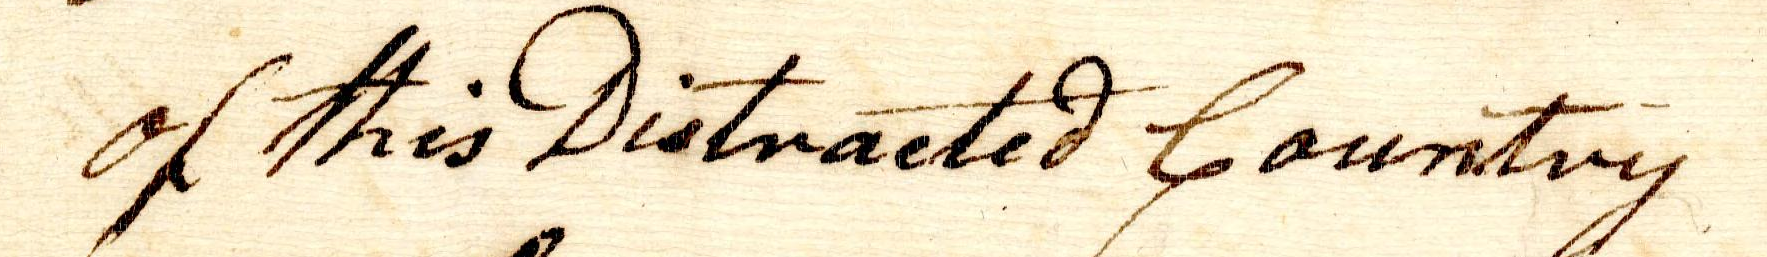of this Distracted Country
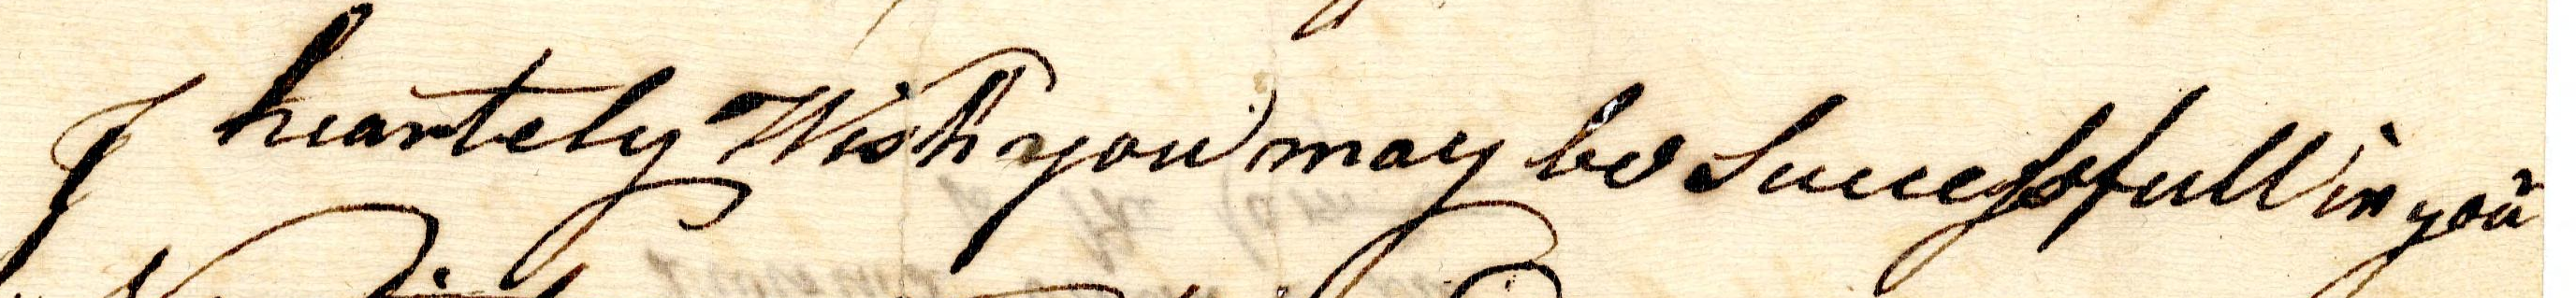I heartely Wish you may be successfull in your
